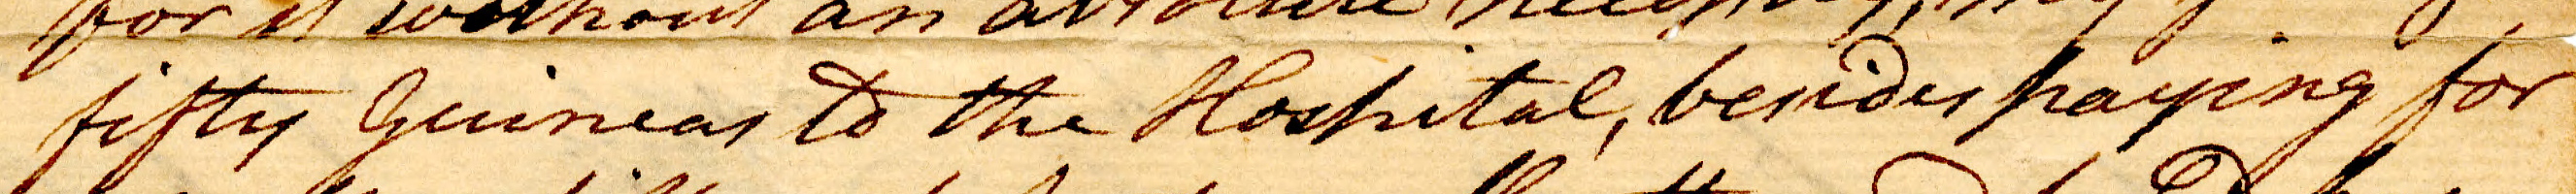fifty Guineas to the Hospital, besides paying for
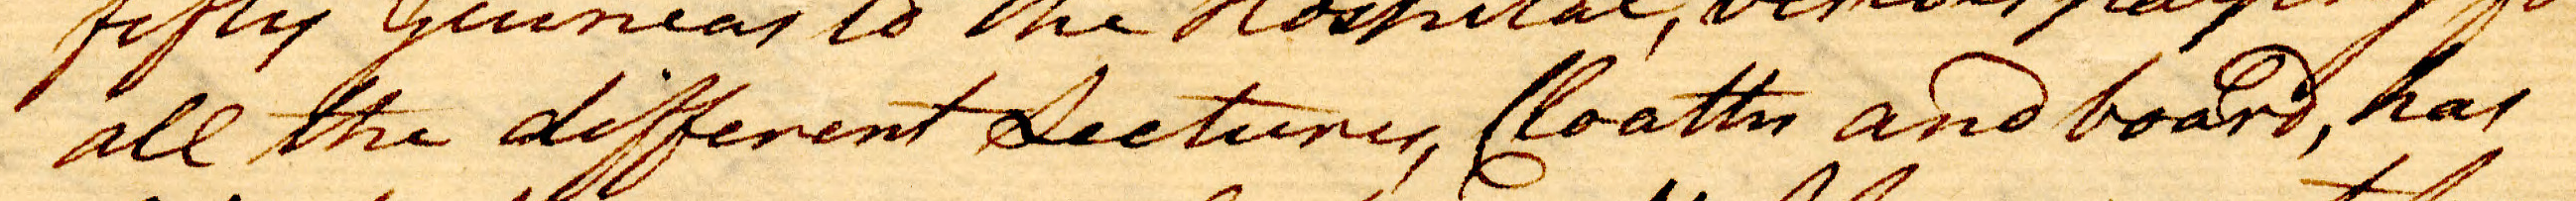all the different Lectures, Cloaths and board, has
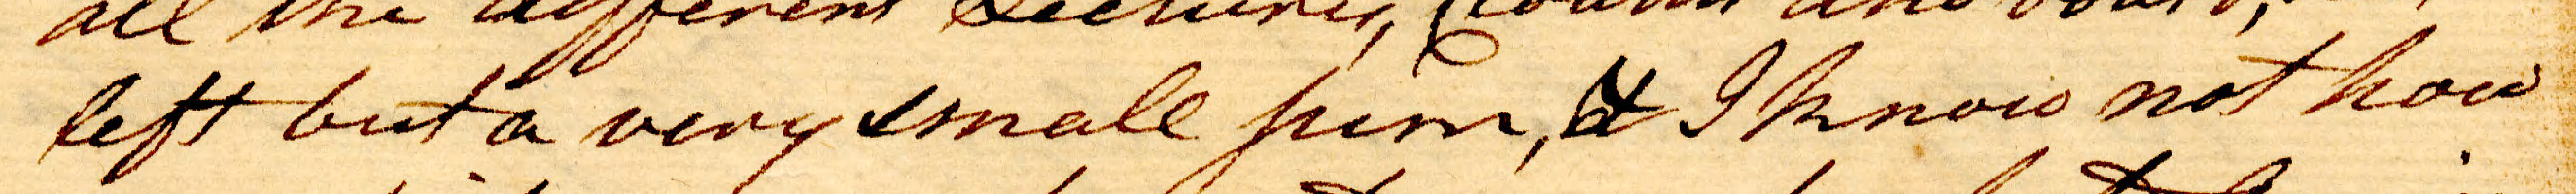left but a very small sum, & I know not how
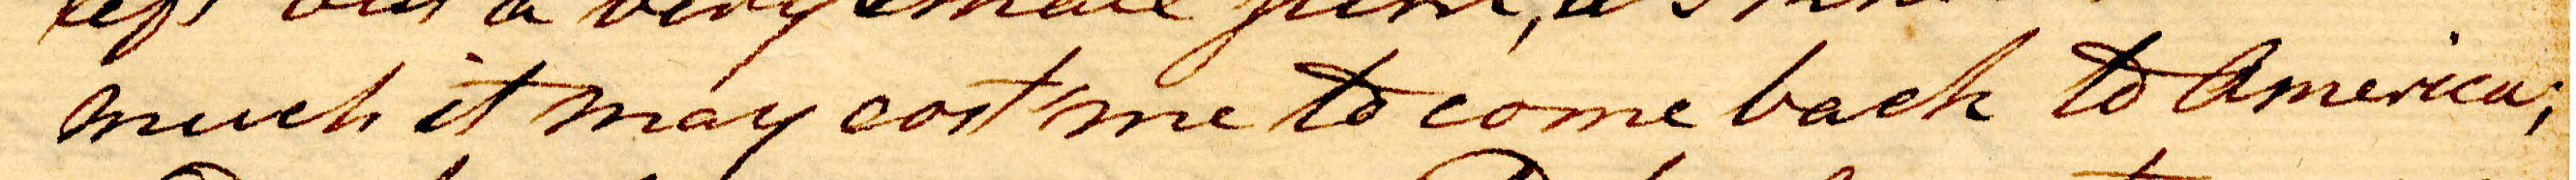much it may cost me to come back to America;
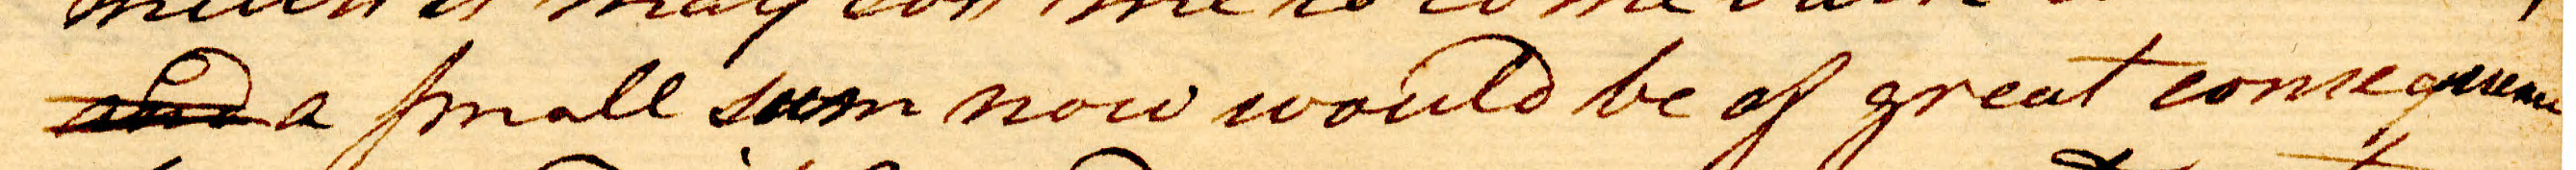[and] a small sum now would be of great consequence
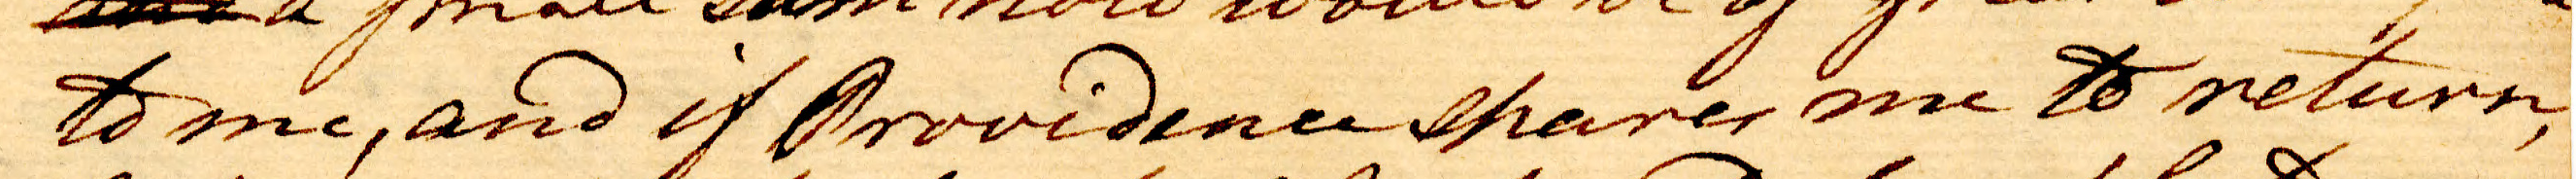to me, and if Providence spares me to return,
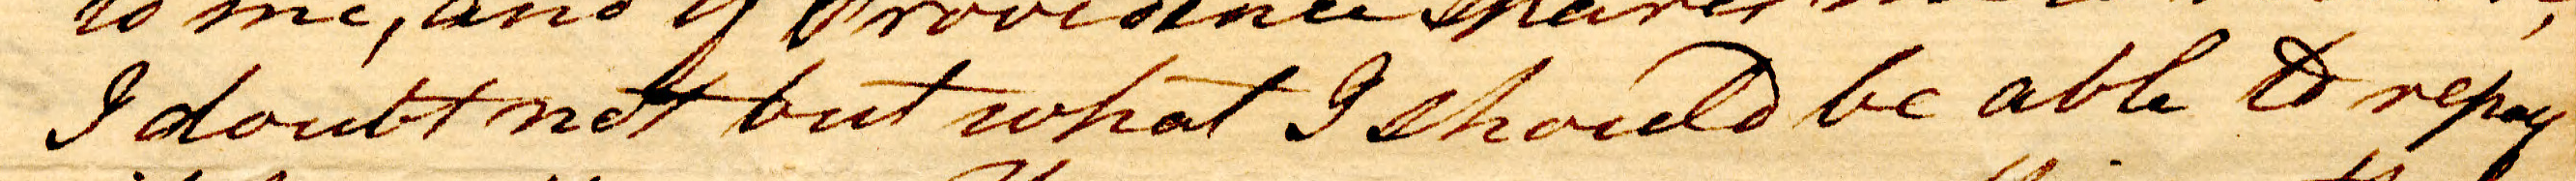I doubt not but what I should be able to repay
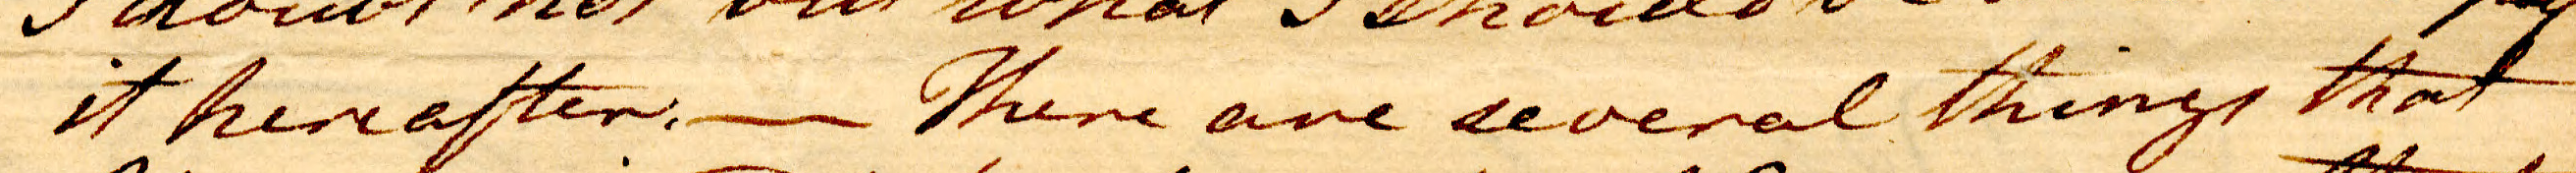it hereafter.- There are several things that
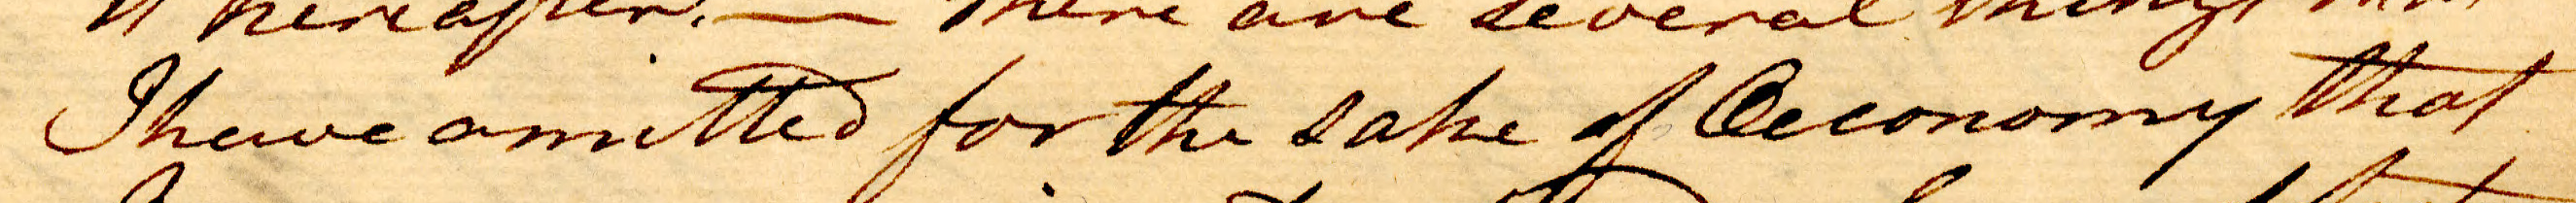I have omitted for the sake of Oeconomy that
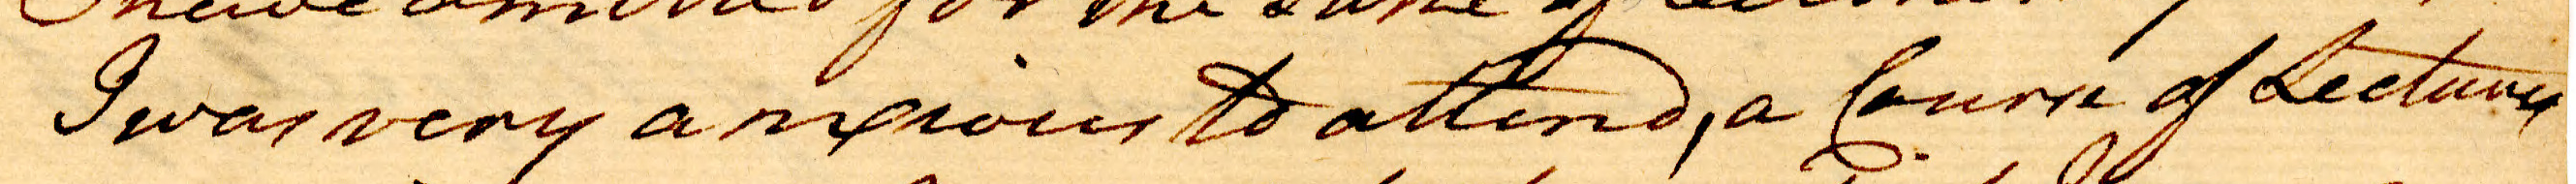I was very anxious to attend a Course of Lectures
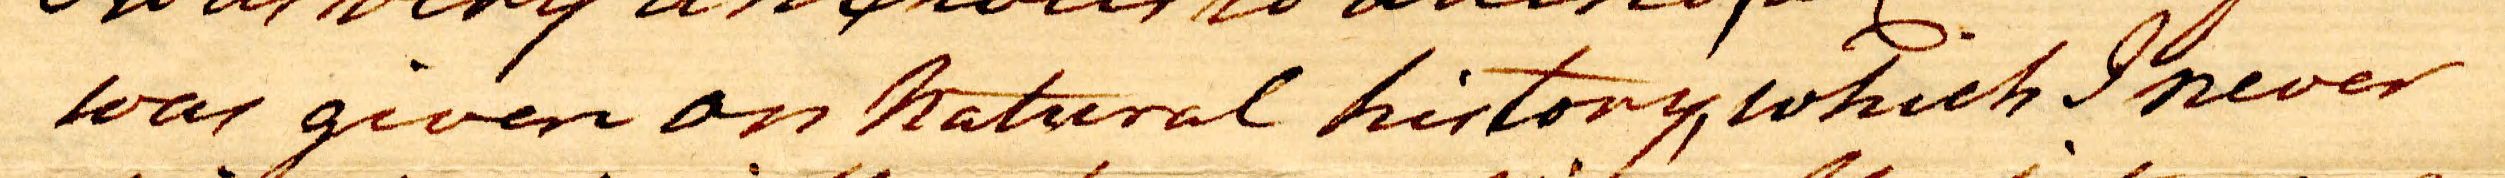was given on Natural history, which I never
